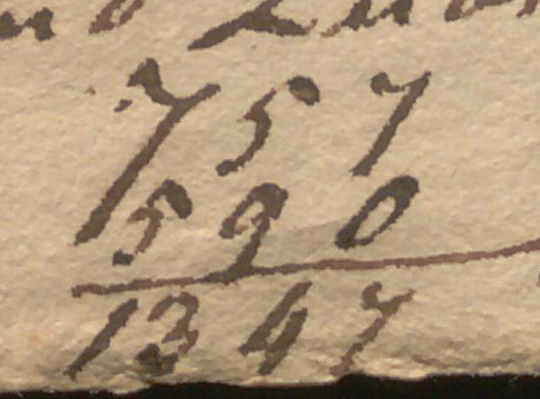1520
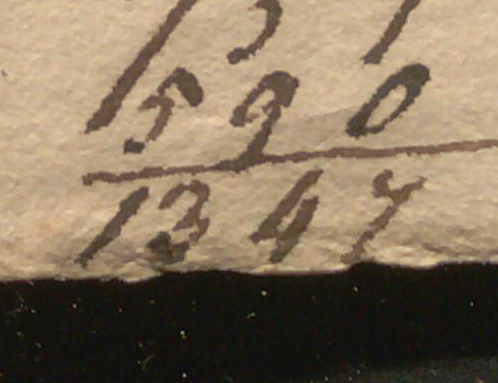1347
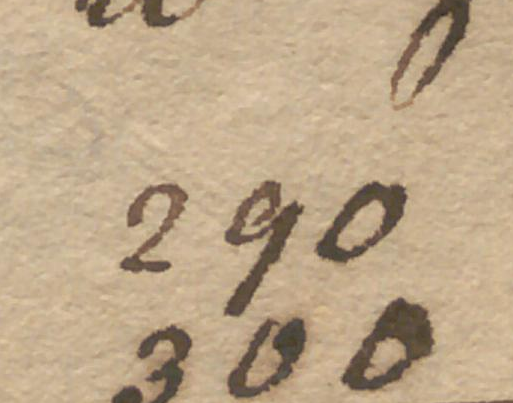290
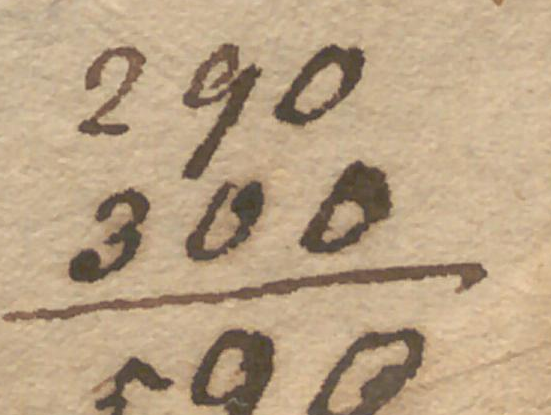300
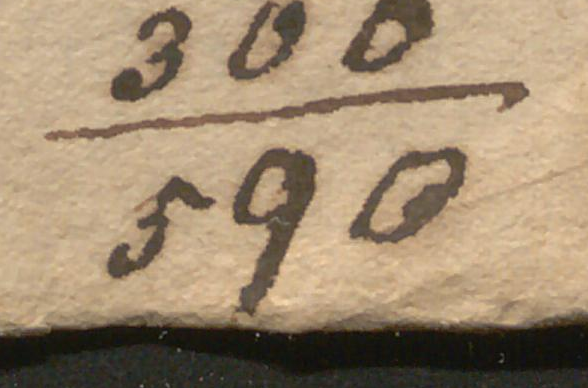590
